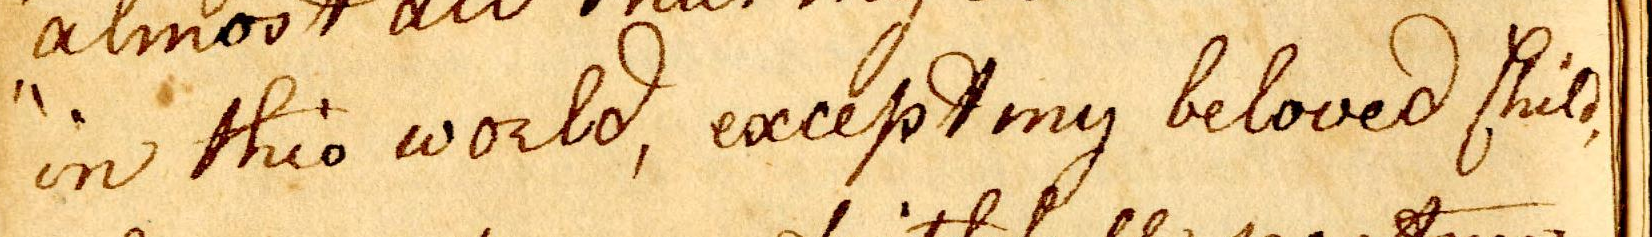in this world, except my beloved Child,
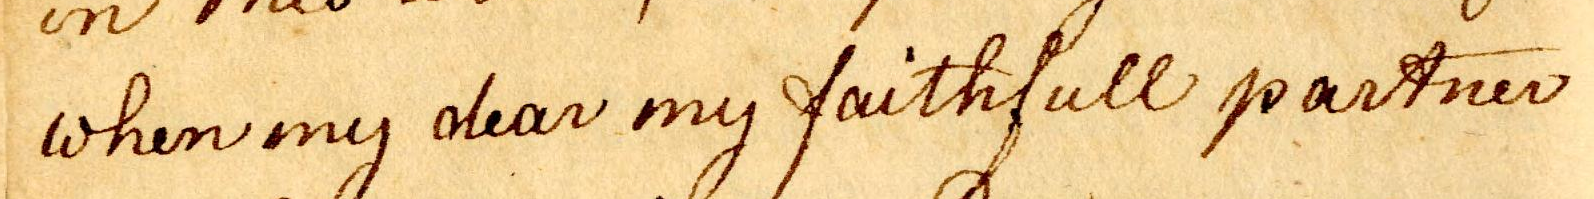when my dear my faithfull partner
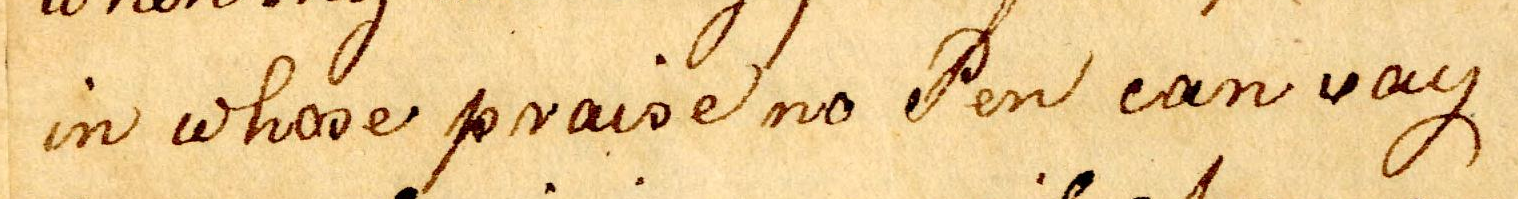in whose praise no Pen can say
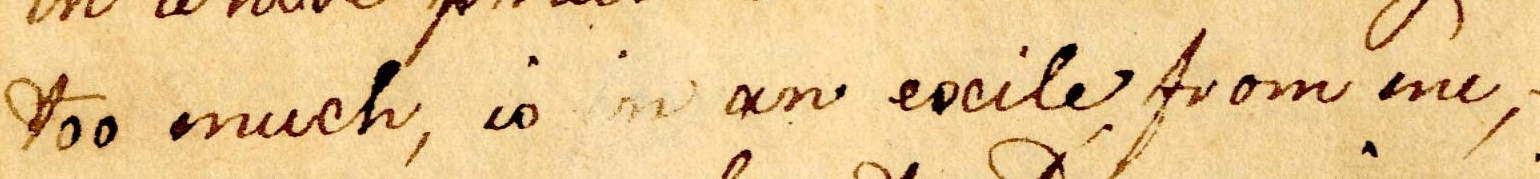too much, is in an exile from me,
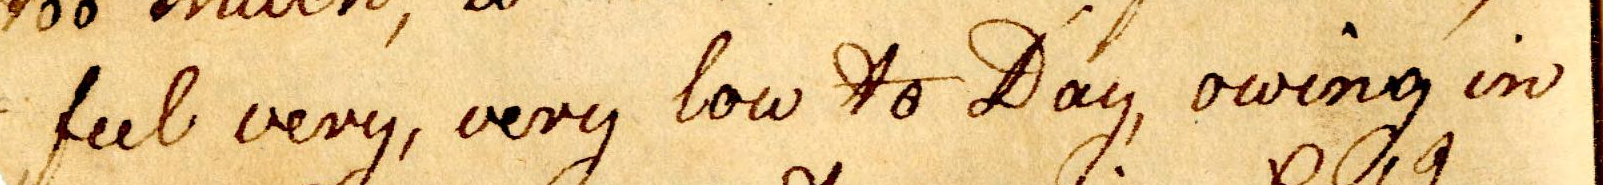feel very, very low to Day owing in
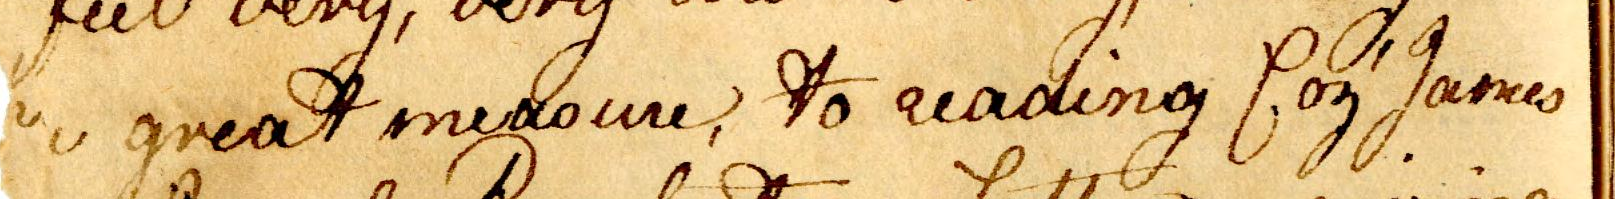a great measure, to reading Coz James
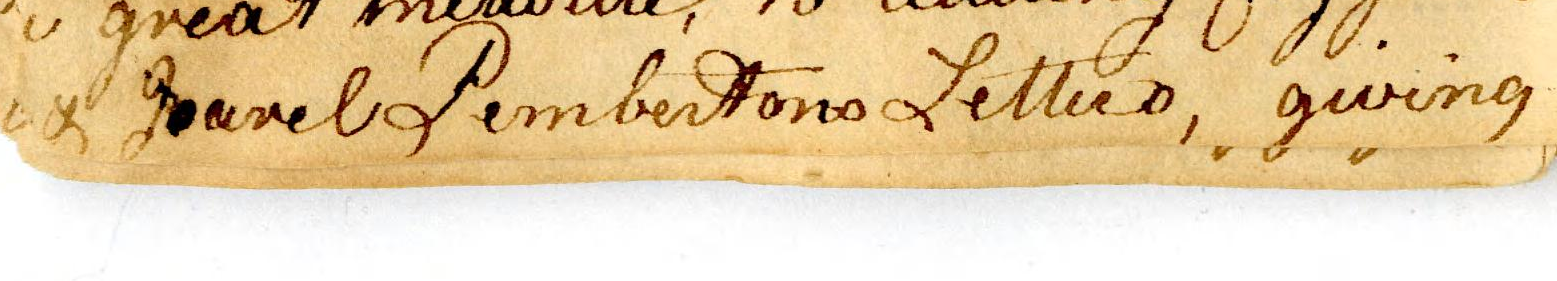& Isarel Pembertons Letters, giving
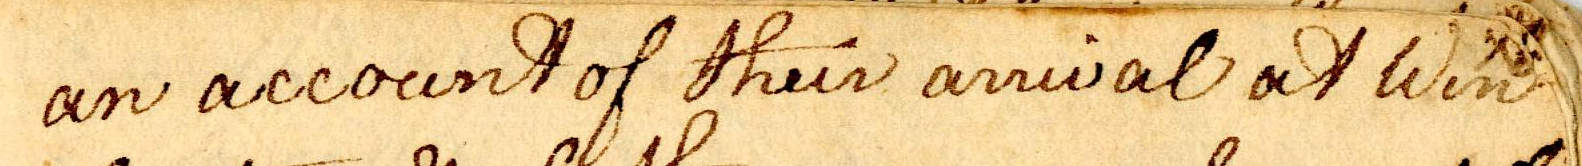an account of their arrival at Win
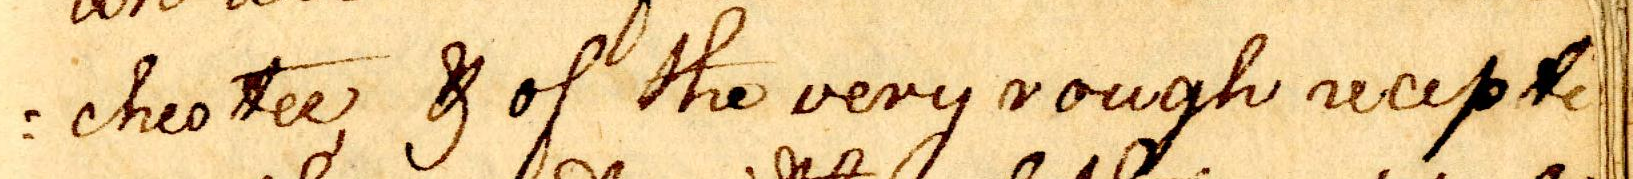-chester & of the very rough recepti
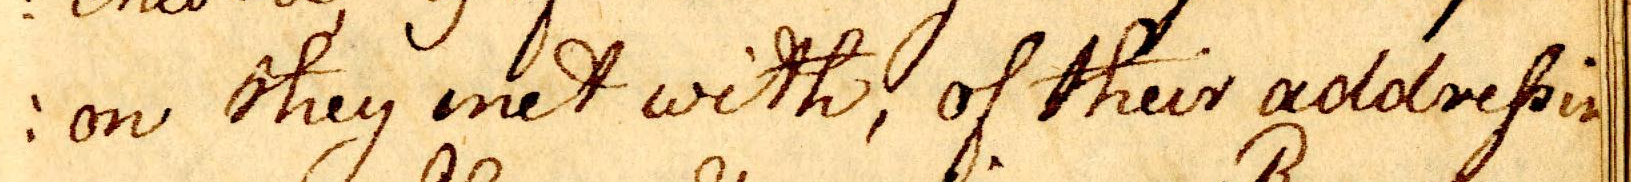-on they met with, of their addressin
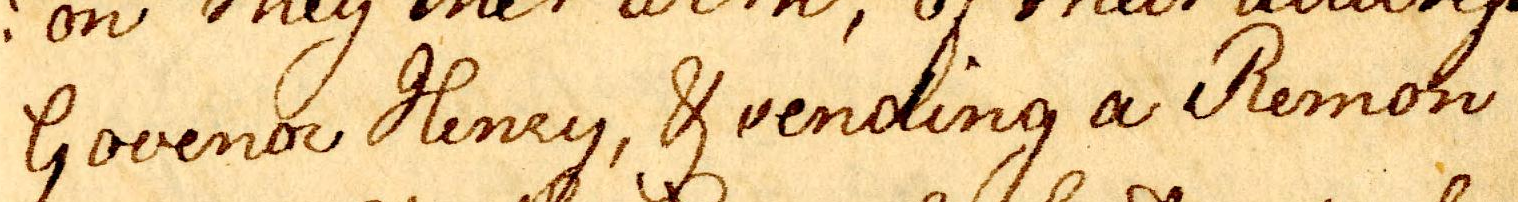Govenor Henry, & sending a Remon
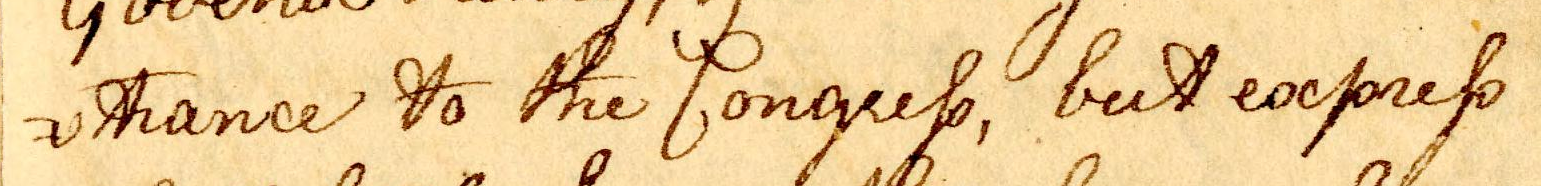-strance to the Congress, but express
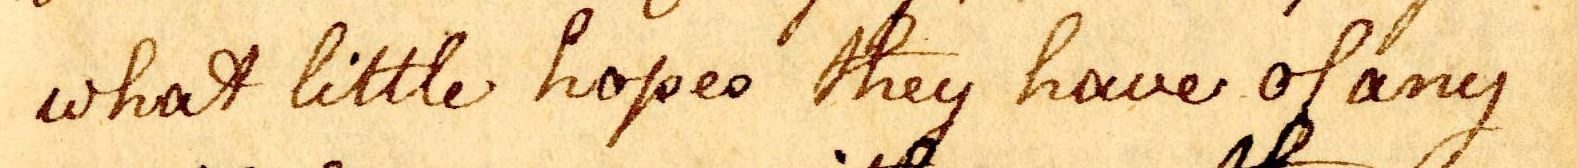what little hopes they have of any
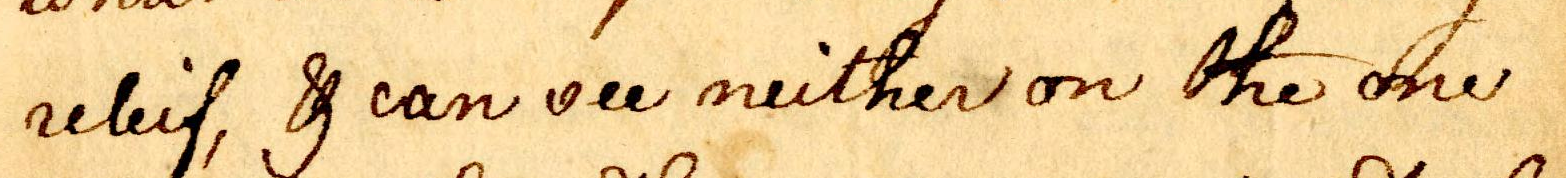releif, & can see neither on the one
